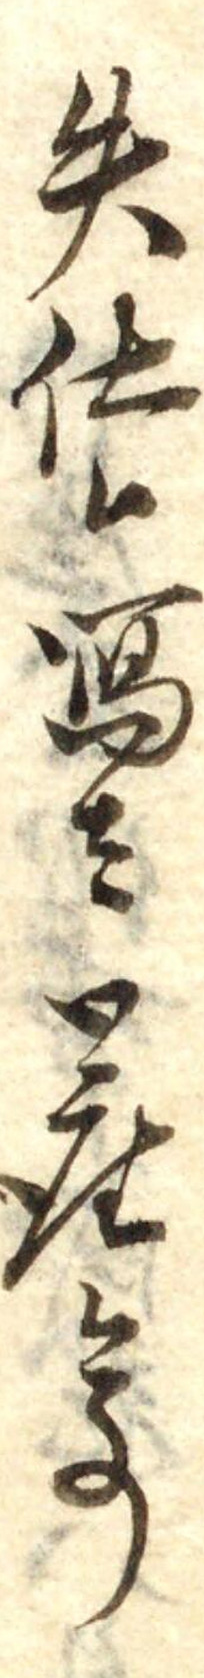失仕候写を御座候事
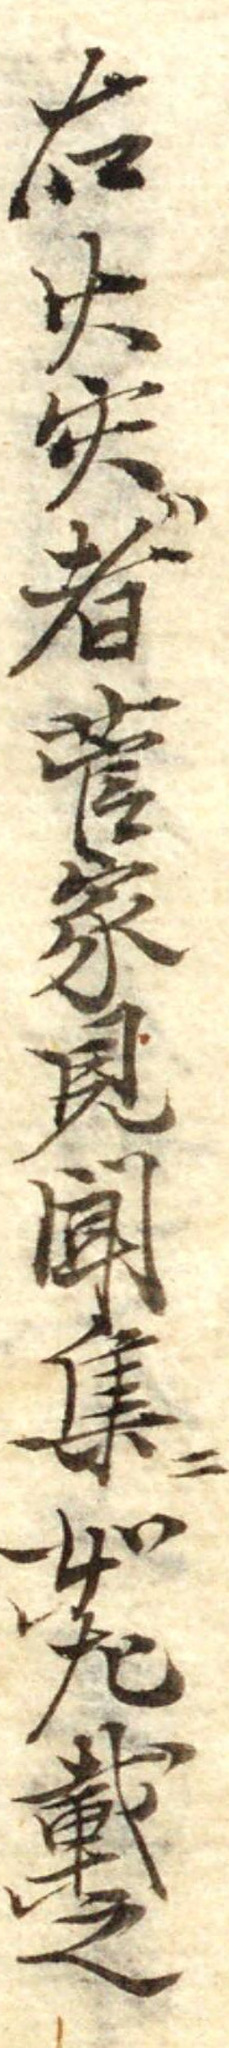右火灾者菅家見聞集に如左載之
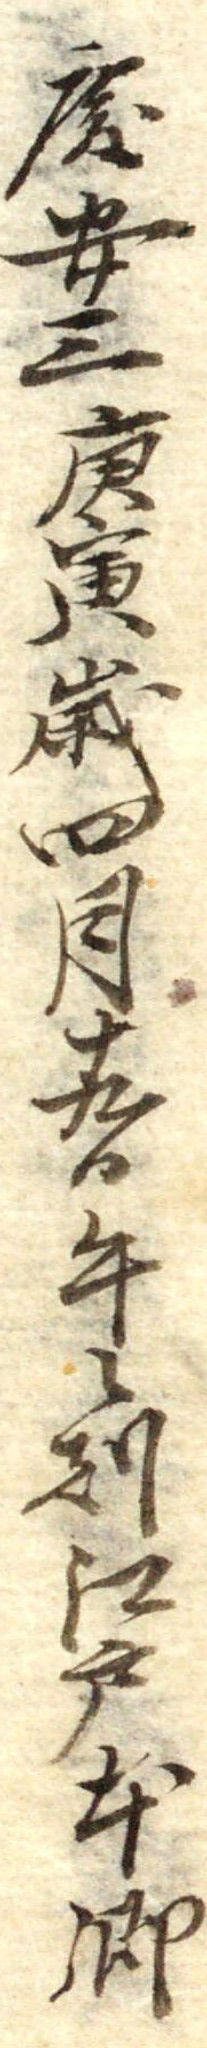慶安三庚寅歳四月十九日午之刻江戸本郷

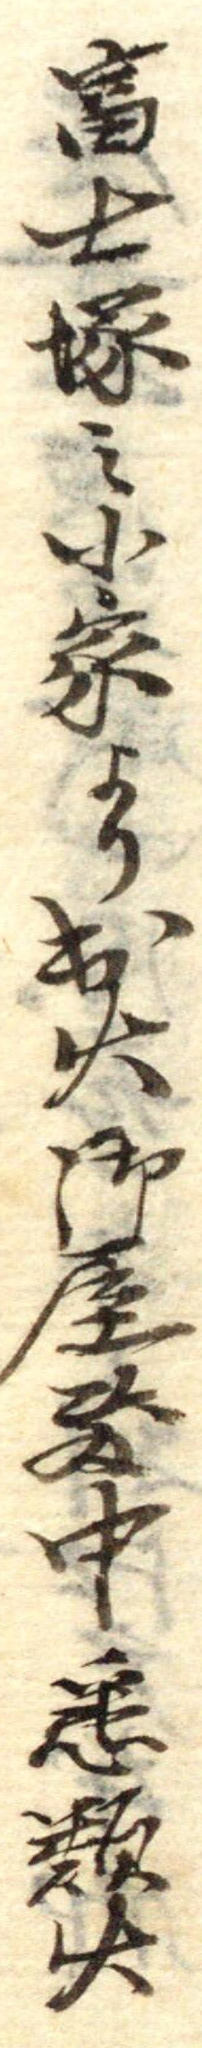富士塚之小家より出火御屋敷中悉類火
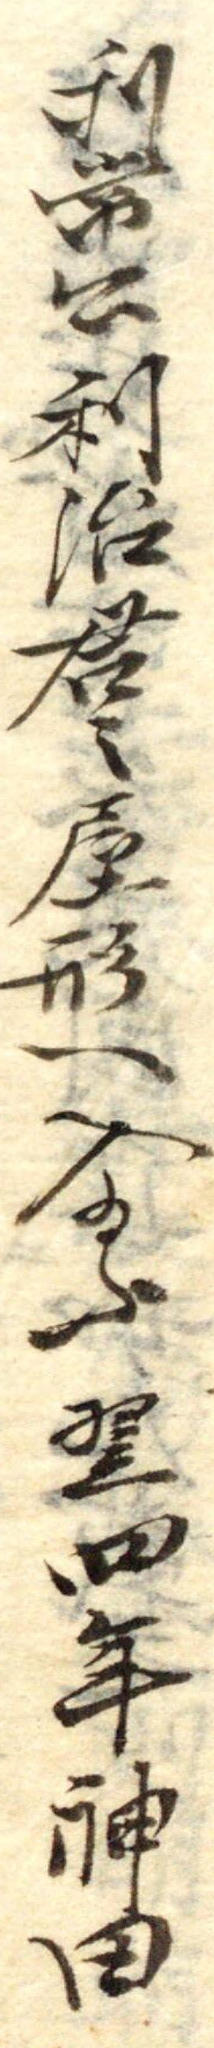利常公利治君之屋形へ入ゐふ翌四年神田
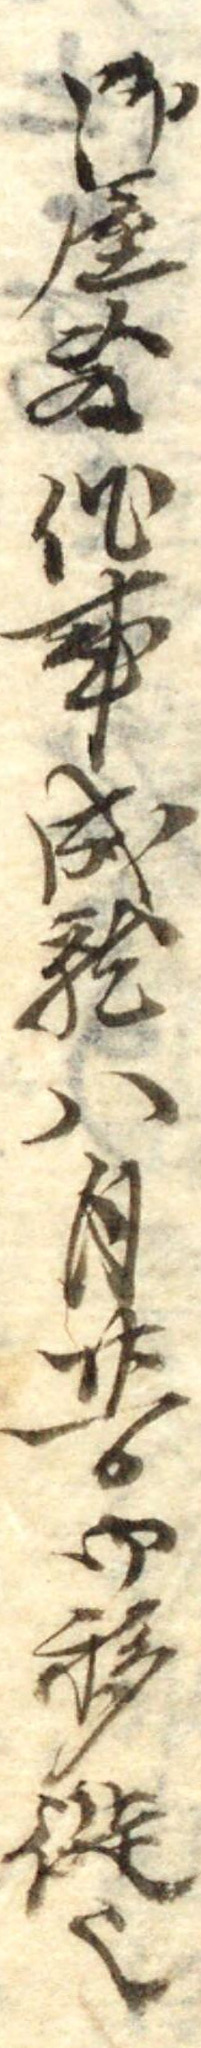御屋敷作事成就八月廿一日御移徒也
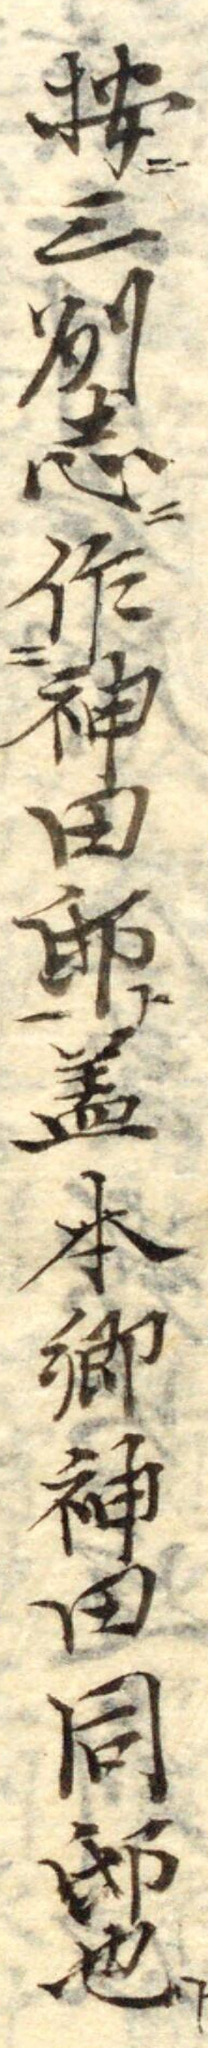按に三州志に作神田邸と蓋本郷神田同邸也と
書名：前田家封国証書集録
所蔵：Ishikawa Prefectural Library
